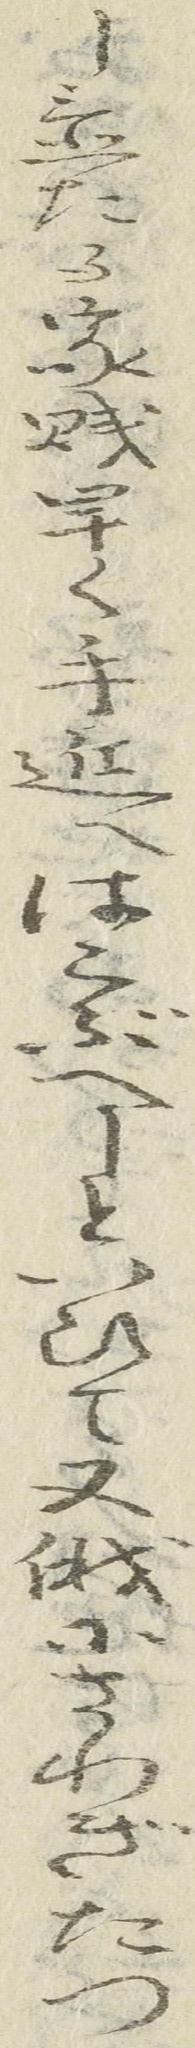し置たる家財早く手近へはこぶへしといひて又俄にさわぎたつ
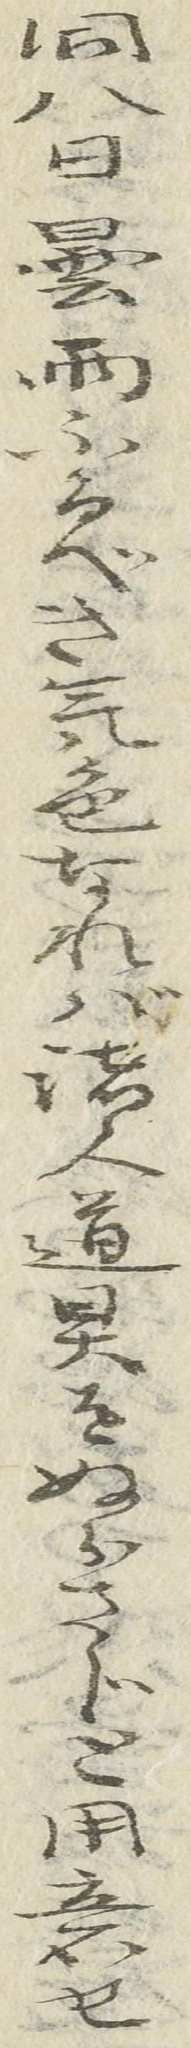同八日曇雨ふるべき気色なれば諸人道具をぬらさじと用意せ
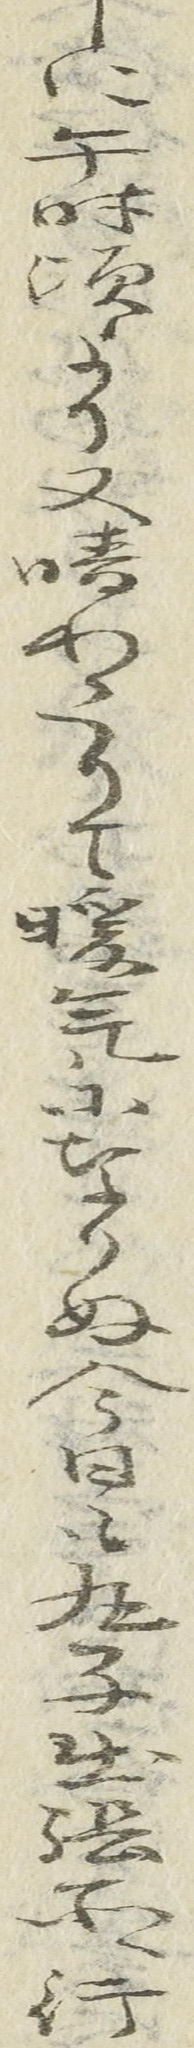しに午時頃より又晴わたりて暖気になりぬ今日も丸子出張所へ行
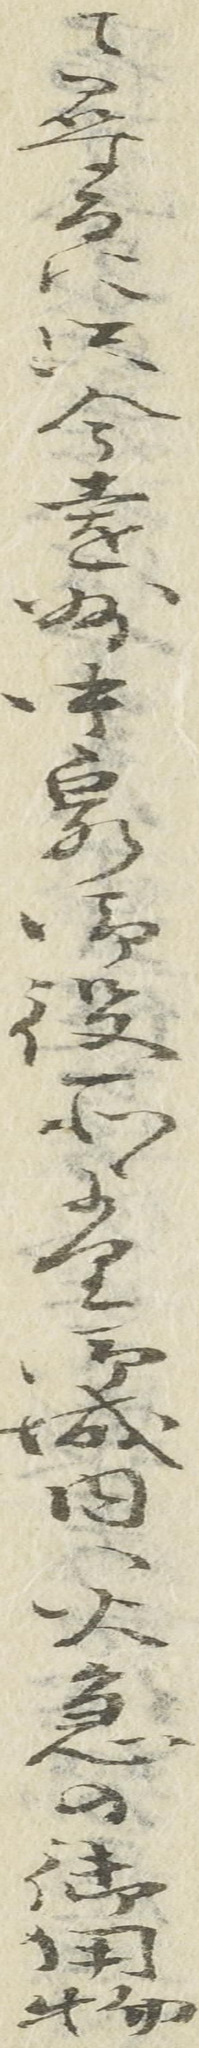て尋るに只今遠州中泉御役所より御城内へ火急の御用物
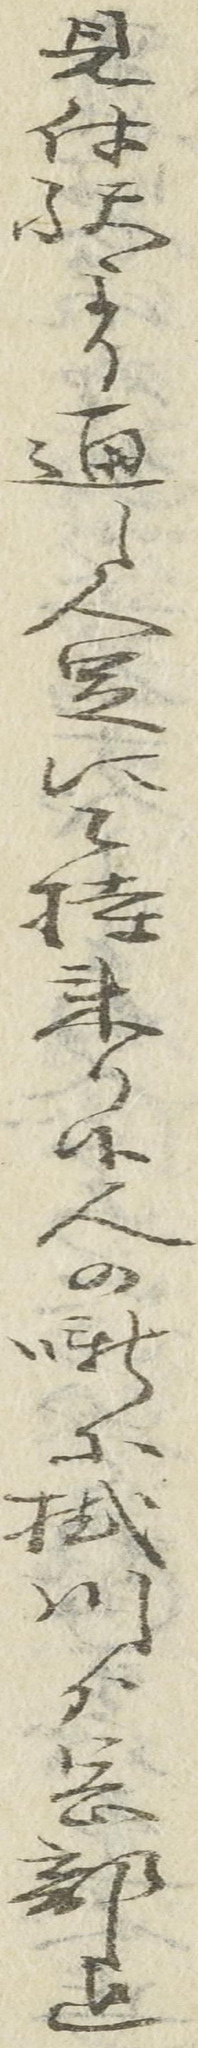見付駅より通し人足にて持来り候人の噺に掛川より岡部迄
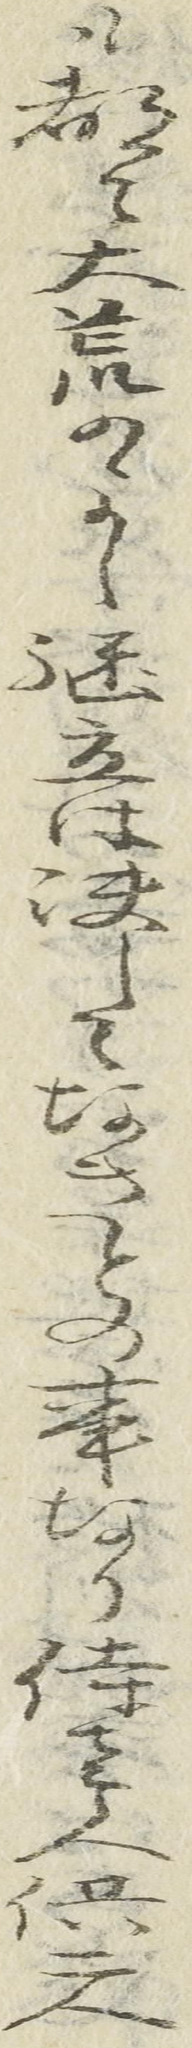も都て大荒のよし継立は決してなきとの事なり侍壱人供二人
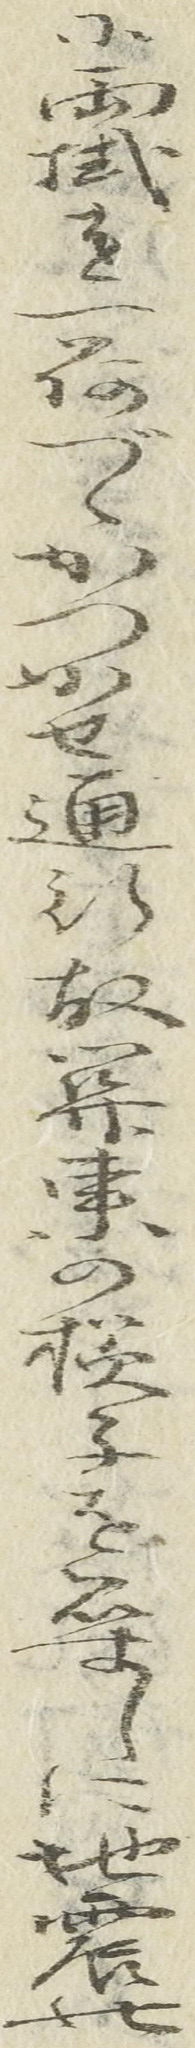に両掛を一荷づゝかつかせ通行故関東の様子を尋しに地震の
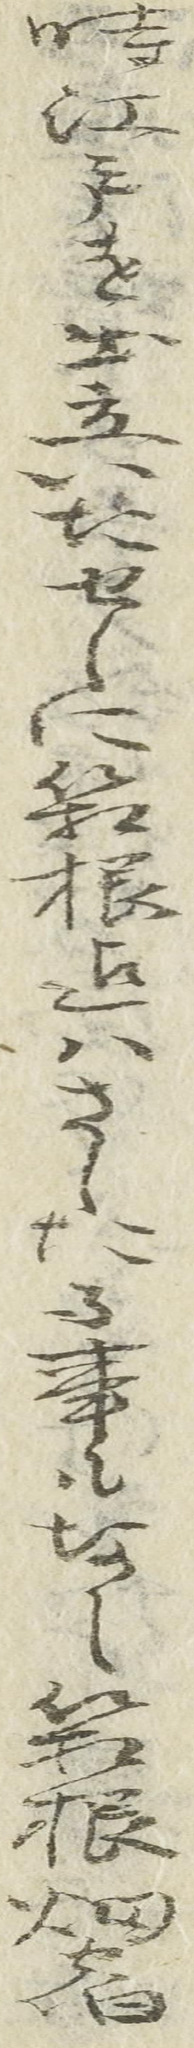時江戸を出立いたせしに箱根迄はさしたる事もなし箱根畑宿
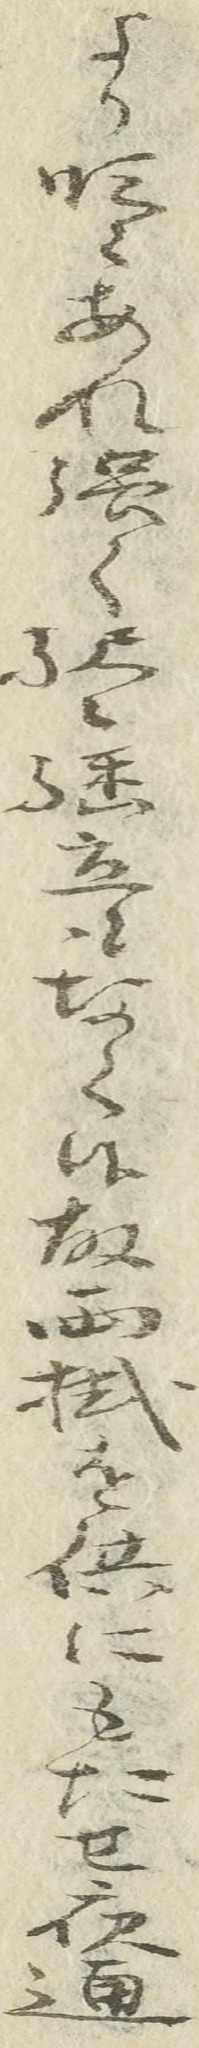より段々あれ強く駅ニ継立もなく候故両掛を供にもたせ夜通
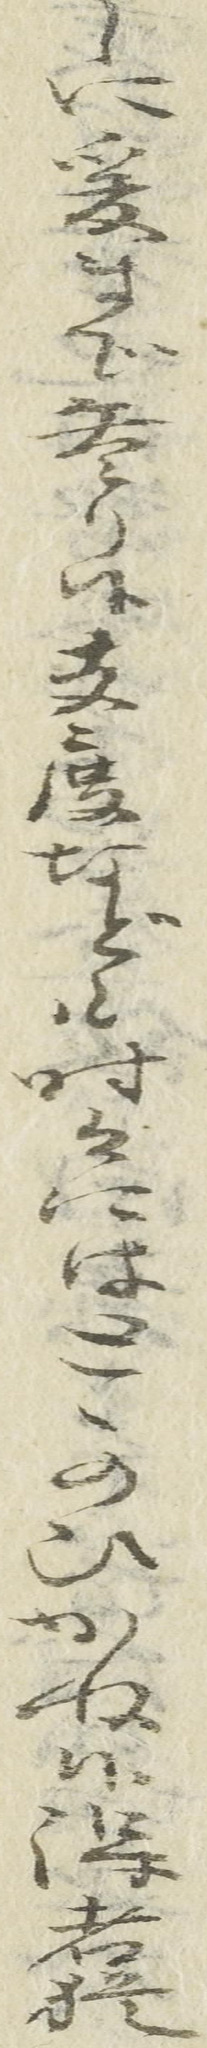しに爰まで参り候支度なども時々にはとゝのひかね候得者猶
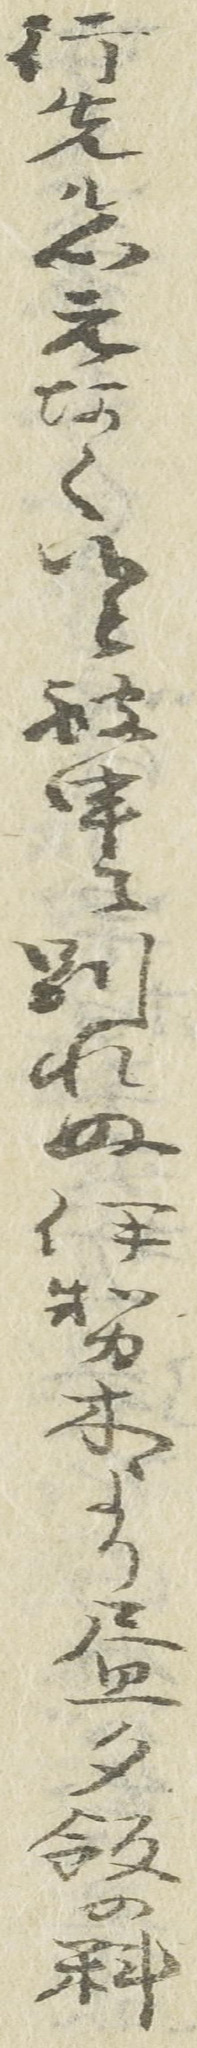行先も心元なく候と被申て別れぬ伊勢木より昼夕飯の料
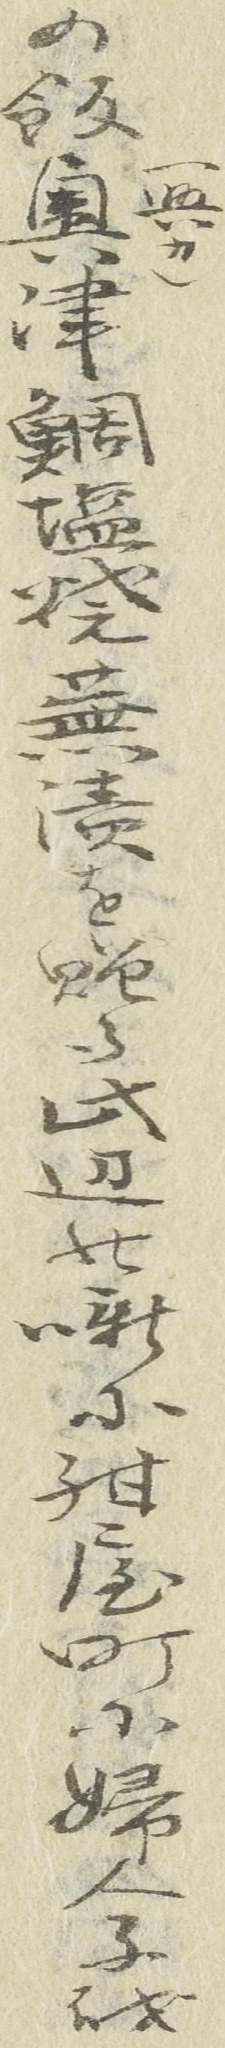の飯奥津鯛塩焼蕪漬を贈る此辺の噺に紺屋町に婦人子を
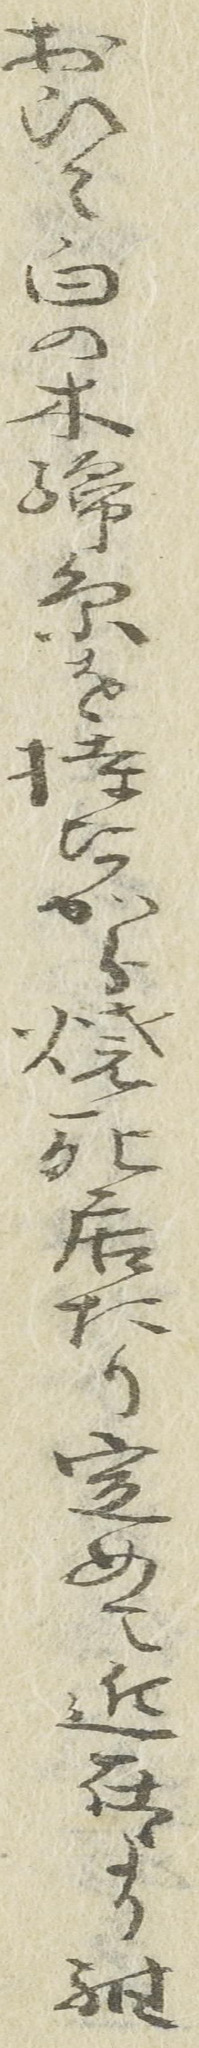おひて白の木綿糸を持なから焼死居たり定めて近在より紺
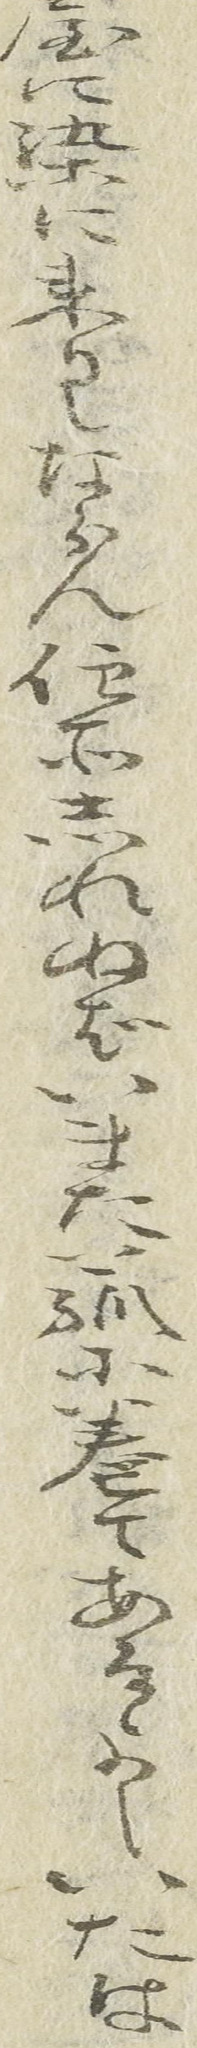屋に染に来りしならん住所しれねばいまた菰に巻てあるよしいたは
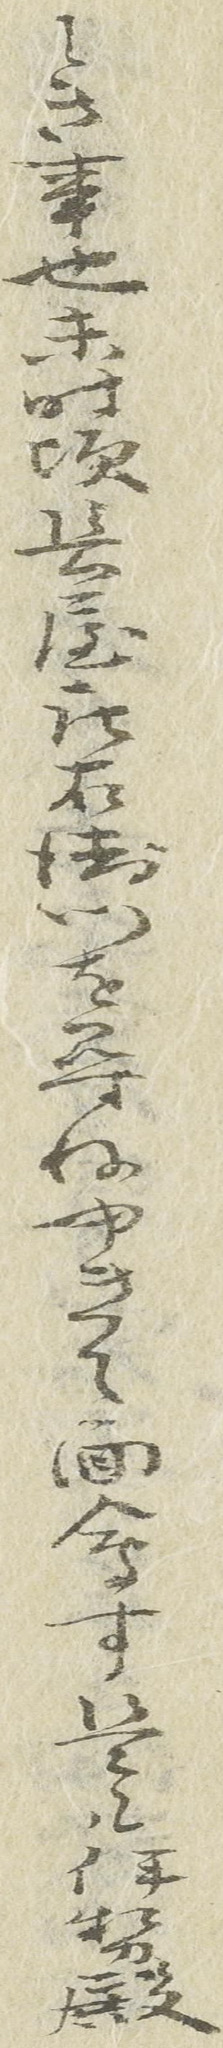しき事也未時頃長屋庄右衛門を尋ねゆきて面会す是も伊勢殿
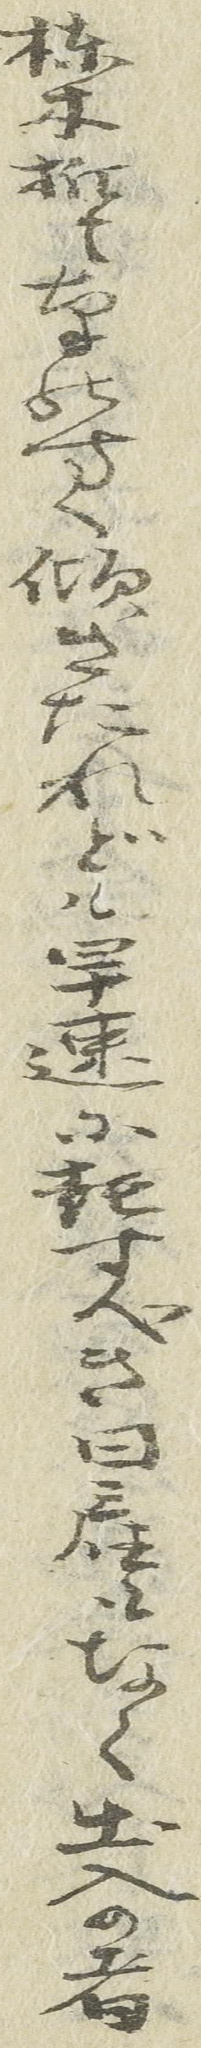棟木折て南の方へ傾きたれども早速に起すべき日雇もなく出入の者
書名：地震前兆集　全
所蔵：東京大学地震研究所図書室 Earthquake Research Institute Library, The University of Tokyo, JAPAN
